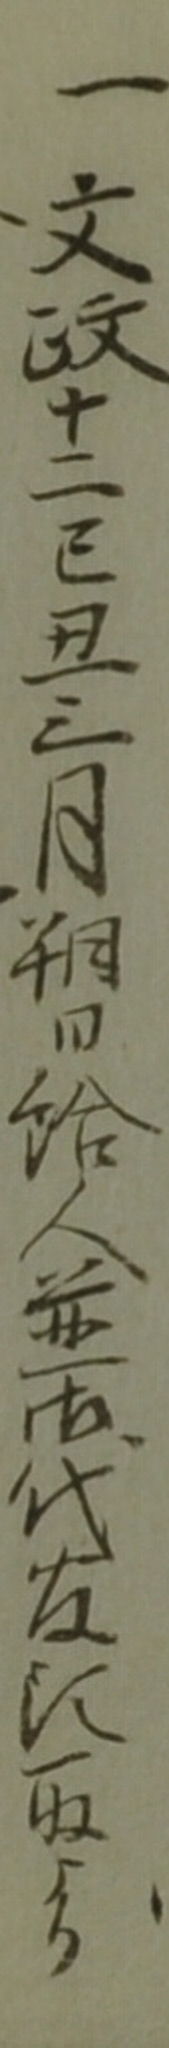一文政十二己丑三月朔日給人並御代官頭取より
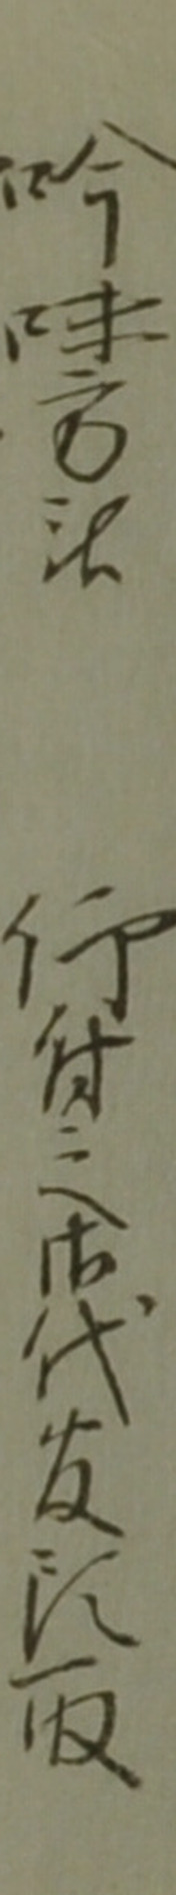吟味方被仰付之御代官頭取
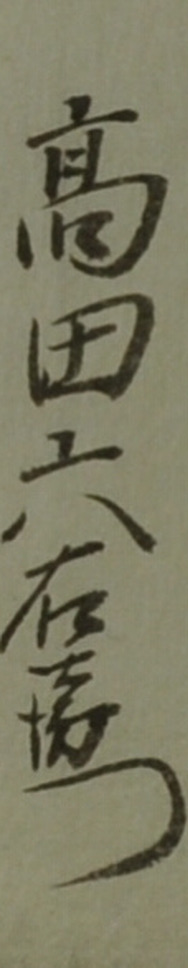高田六右衛門
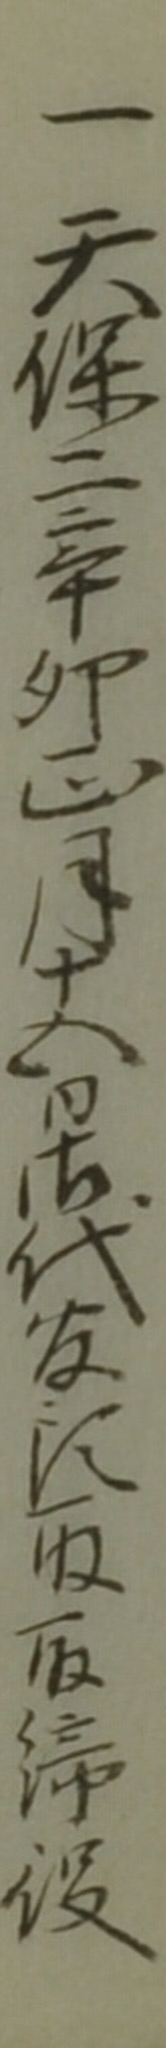一天保二辛卯正月十五日御代官頭取取締役
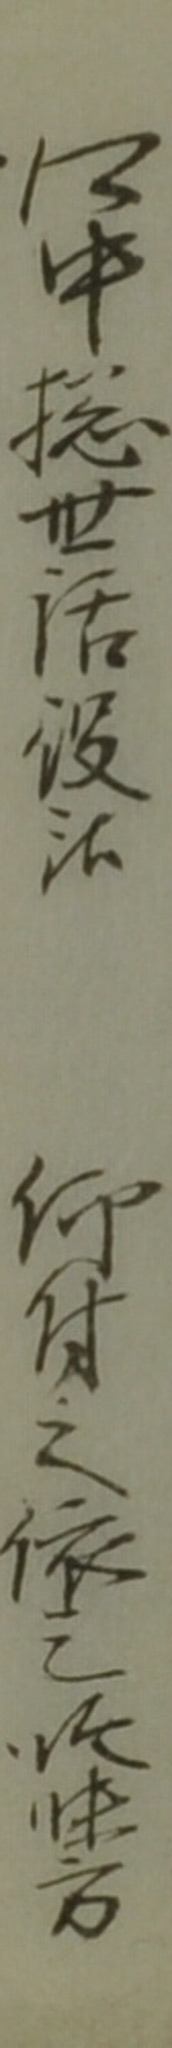郷中揔世話役被仰付之依之吟味方
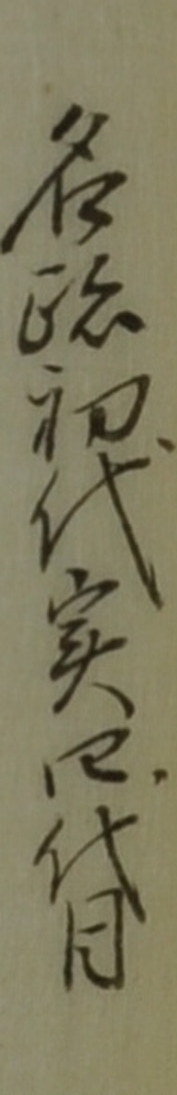名跡初代実四代目
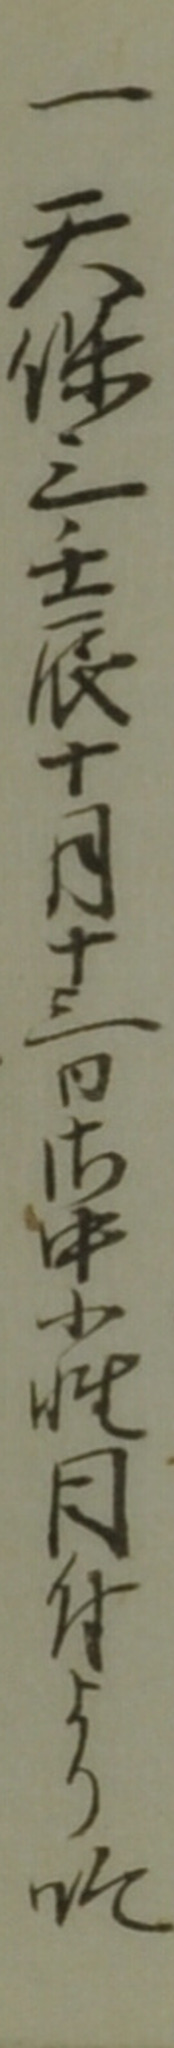一天保三壬辰十月十三日御中小姓目付より吟
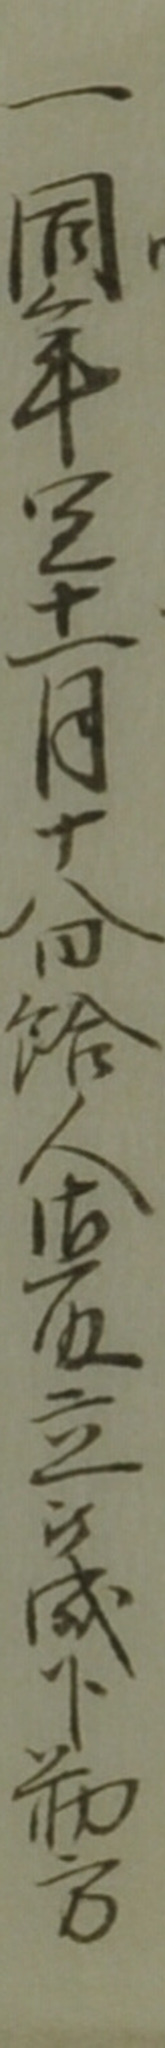一同年閏十一月十八日給人御取立被成下勤方
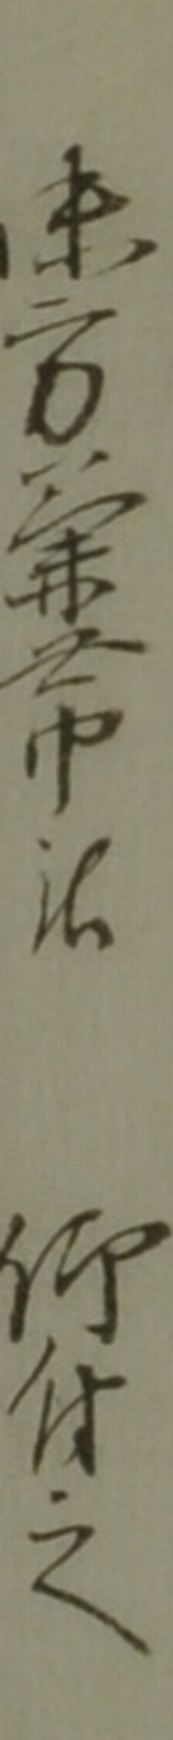吟味方兼帯被仰付之
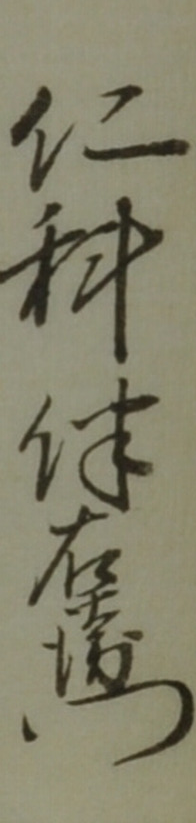仁科伴右衛門
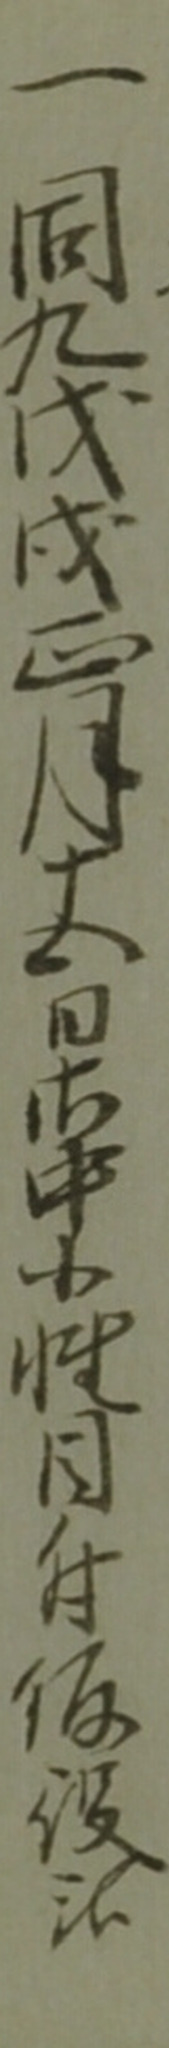一同九戊戌正月十五日御中小姓目付仮役被
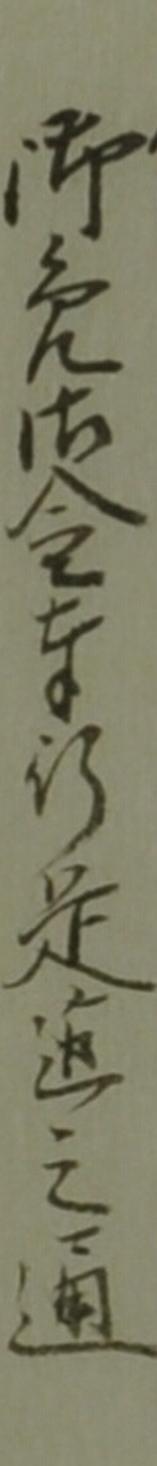御免御金奉行是迄之通

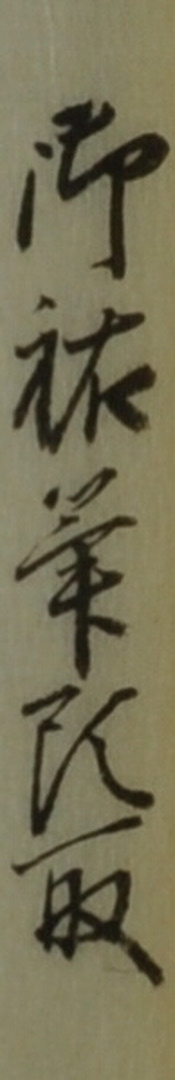御祐筆頭取
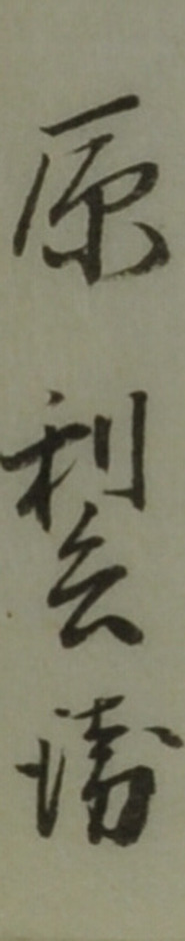原利兵衛
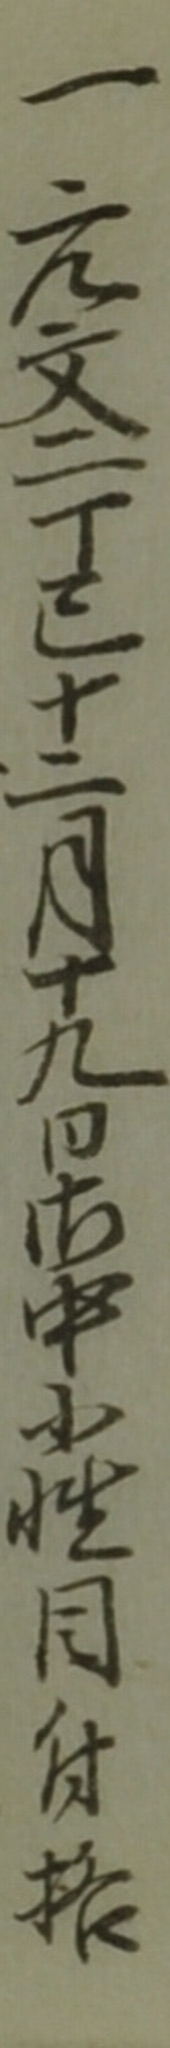一元文丁巳十二月十九日御中小姓目付格
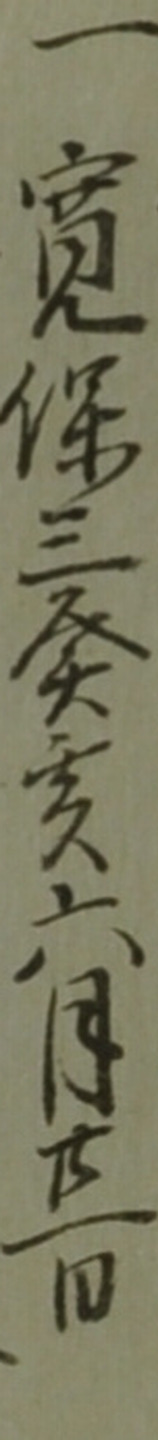一寛保三癸亥六月廿一日
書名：諸御役代々録（八）
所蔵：伊那市立高遠町図書館・合同会社AMANE
